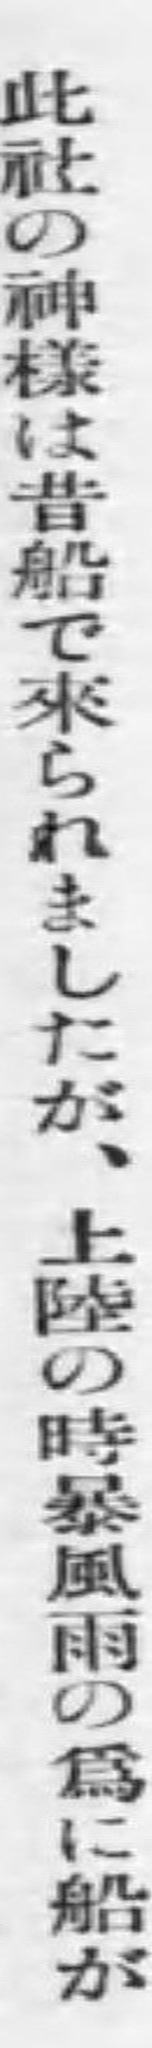此社の神様は昔船で来られましたが、上陸の時暴風雨の為に船が
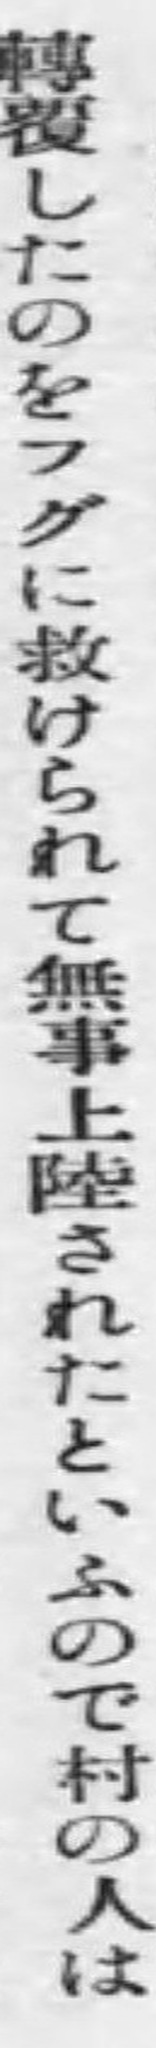転覆したのをフグに救けられて無事上陸されたといふので村の人は
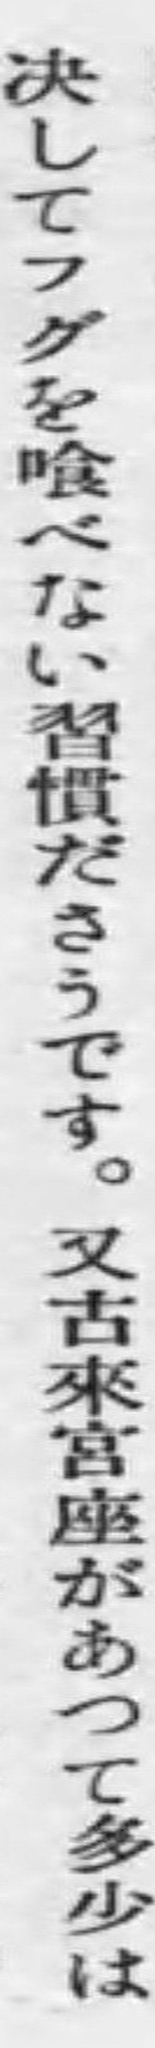決してフグを喰べない習慣ださうです。又古来宮座があつて多少は
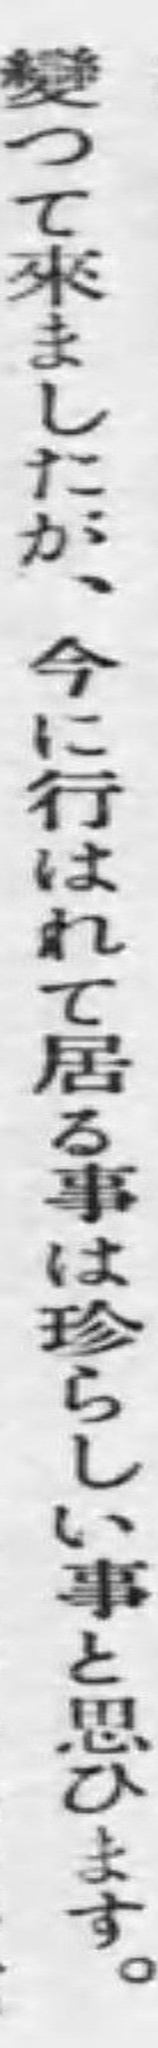変つて来ましたが、今に行はれて居る事は珍らしい事と思ひます。
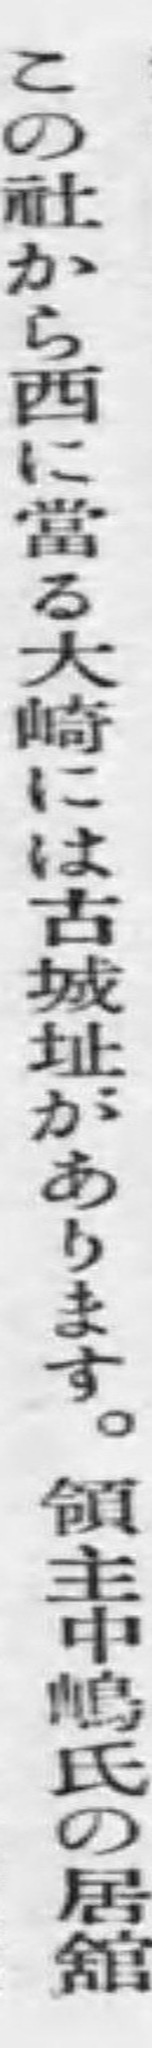この社から西に当る大崎には古城址があります。領主中嶋氏の居館
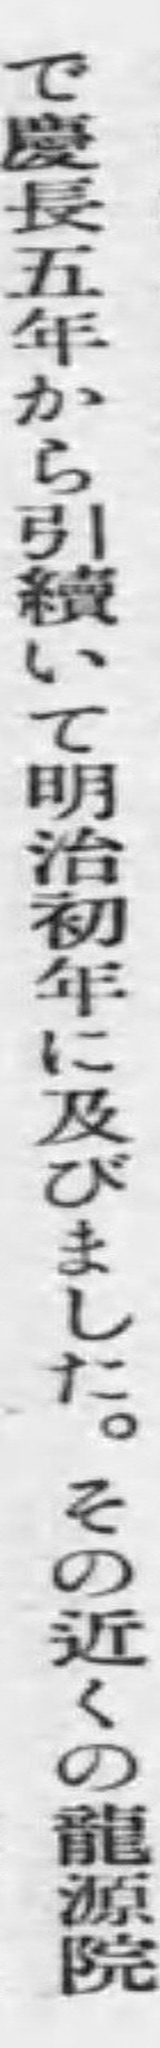で慶長五年から引続いて明治初年に及びました。その近くの龍源院
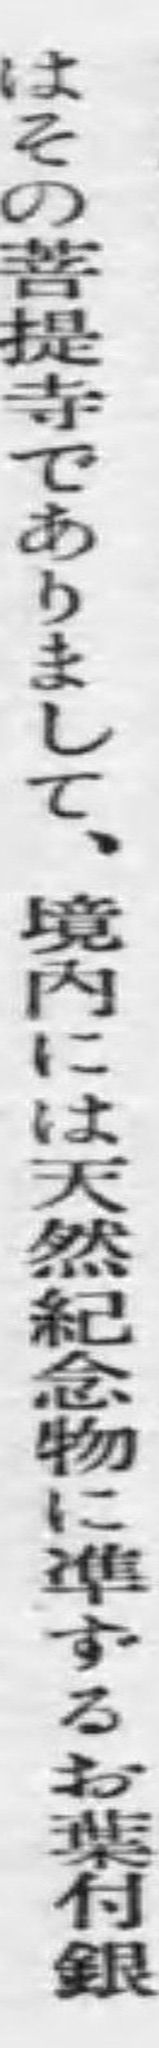はその菩提寺でありまして、境内には天然紀念物に準ずるお葉付銀
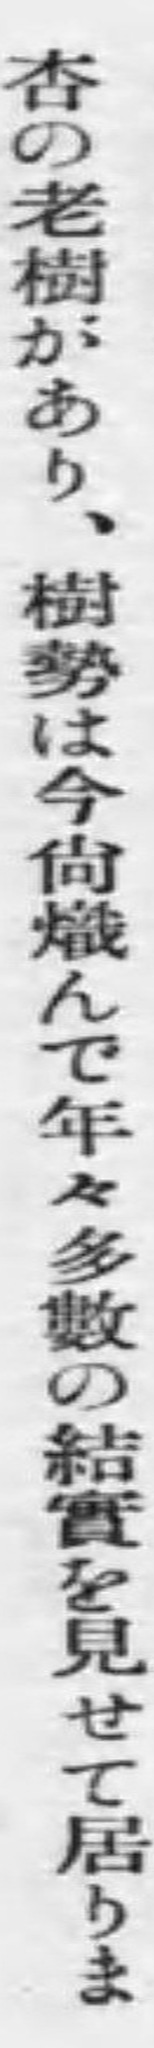杏の老樹があり、樹勢は今尚熾んで年々多数の結実を見せて居りま
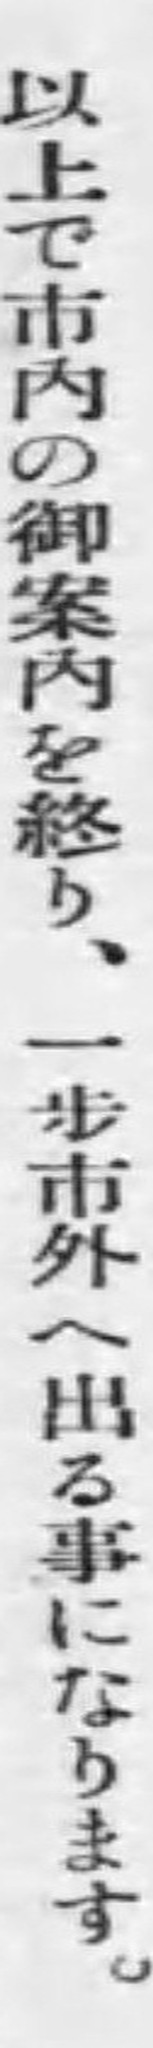以上で市内の御案内を終り、一歩市外へ出る事になります。
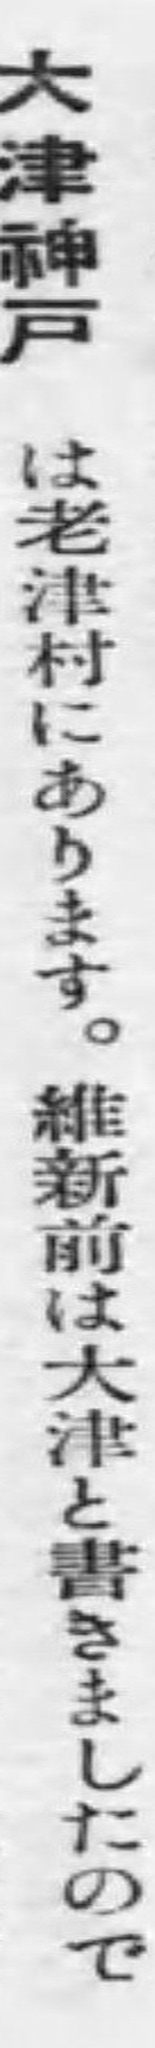大津神戸は老津村にあります。維新前は大津と書きましたので
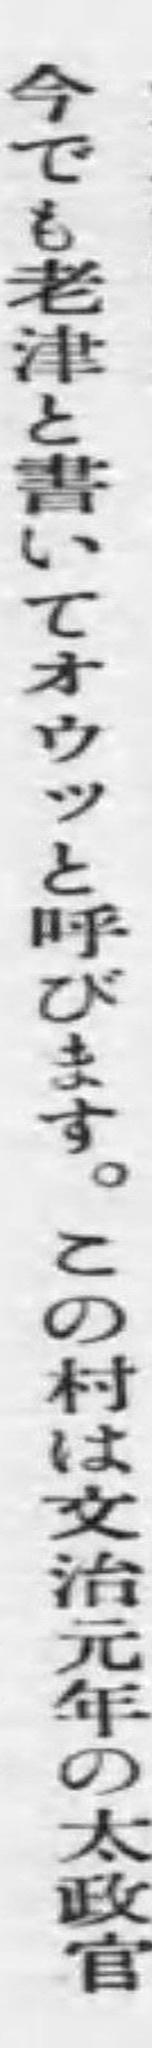今でも老津と書いてオウツと呼びます。この村は文治元年の太政官
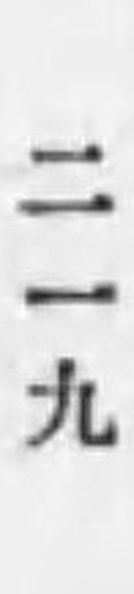二一九

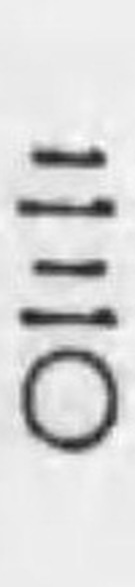二二〇
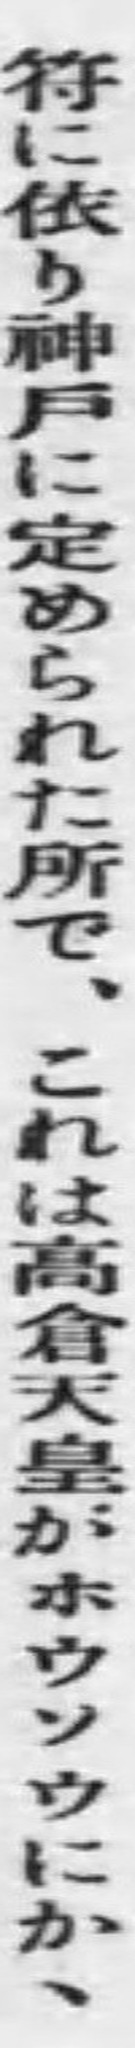符に依り神戸に定められた所で、これは高倉天皇がホウソウにかゝ
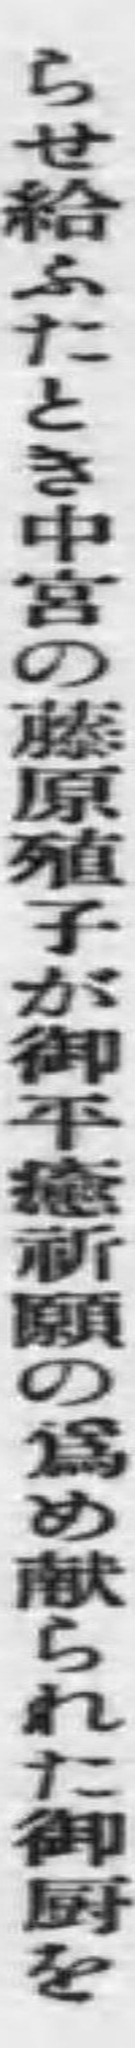らせ給ふたとき中宮の藤原殖子が御平癒祈願の為め献られた御厨を
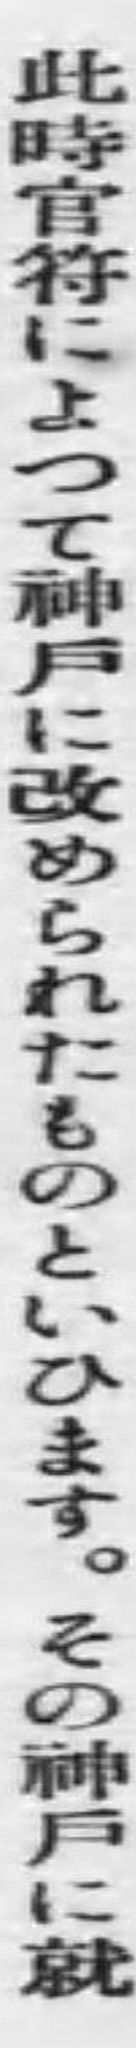此時官符によつて神戸に改められたものといひます。その神戸に就
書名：東三河道中記 : 豊橋市及其附近案内
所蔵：国立国会図書館 National Diet Library, JAPAN
